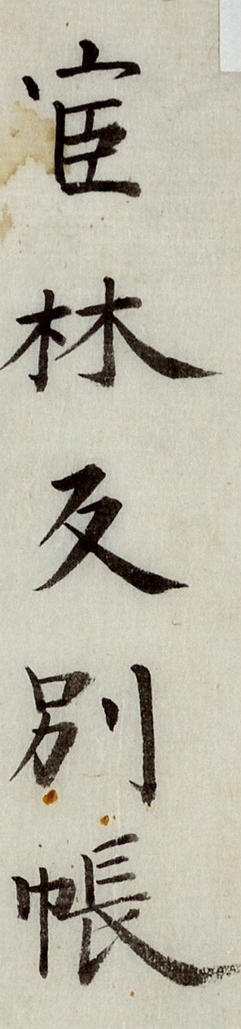官林反別帳

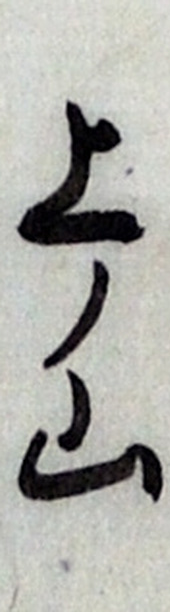上ノ山
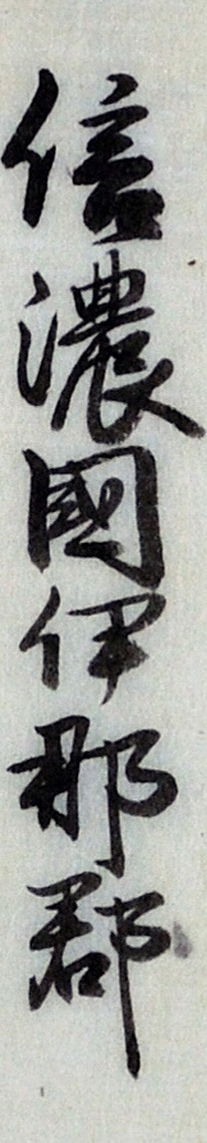信濃国伊那郡
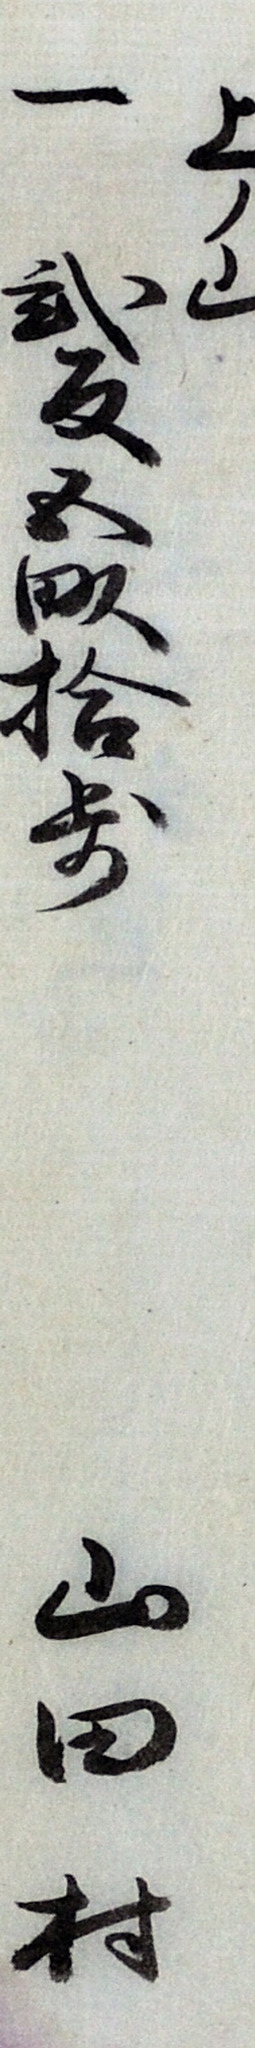一弐反五㽗拾歩山田村
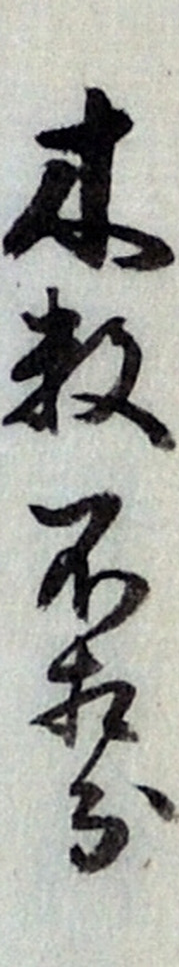木数不相分
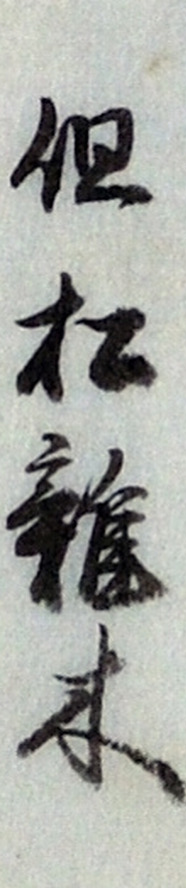但松雑木
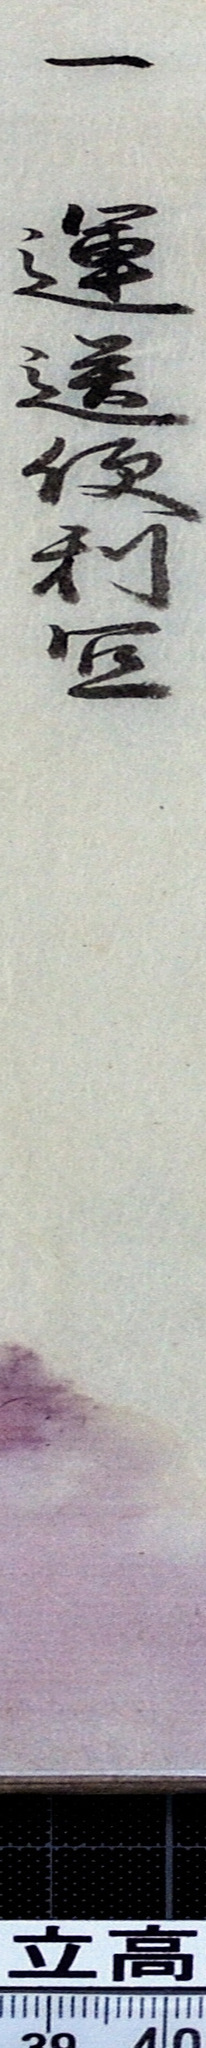一運送便利宜
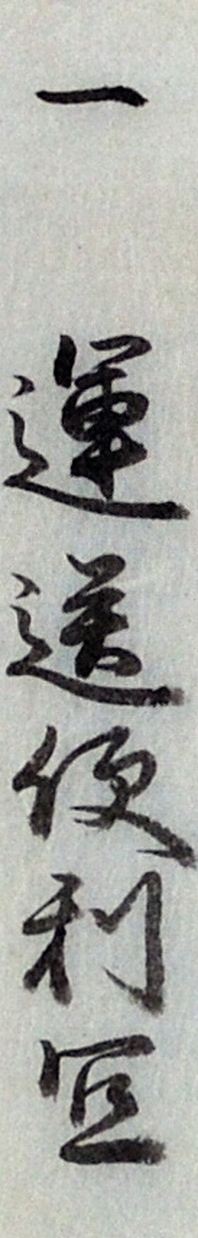一運送便利宜
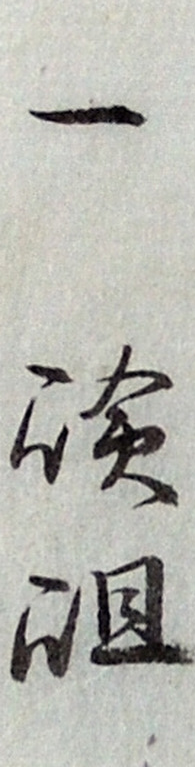一嶮岨

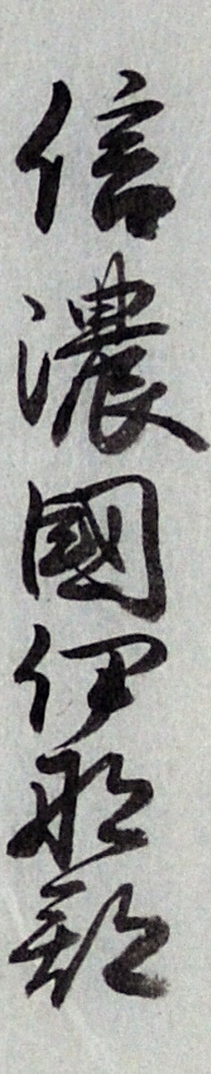信濃国伊那郡
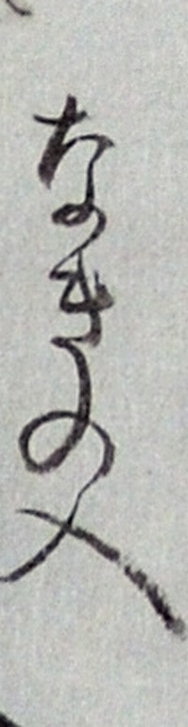なきの入
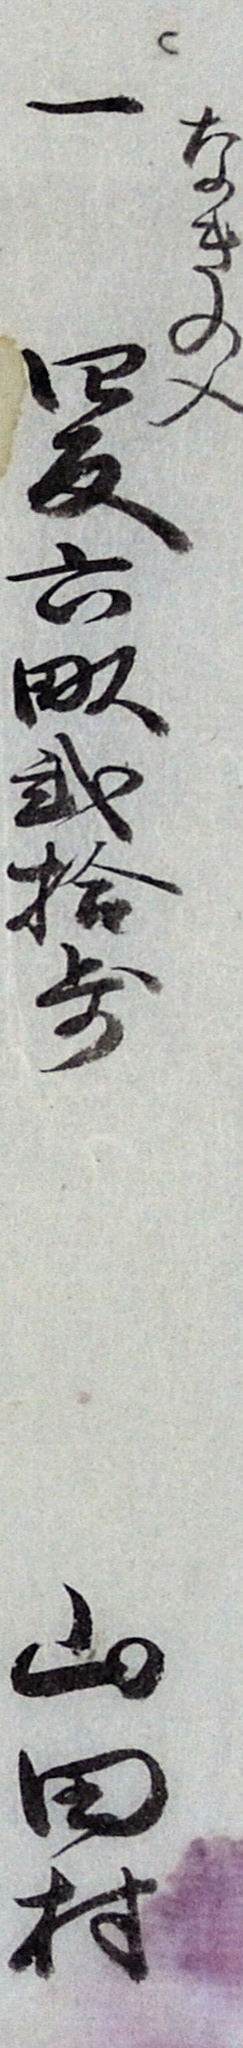一四反六㽗弐拾歩山田村
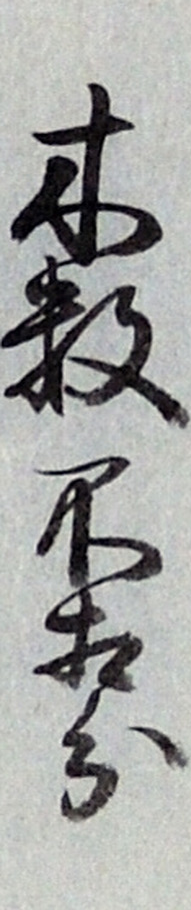木数不相分
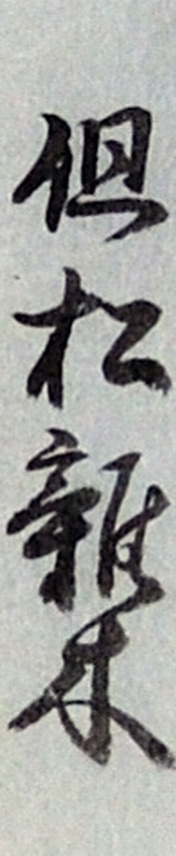但松雑木
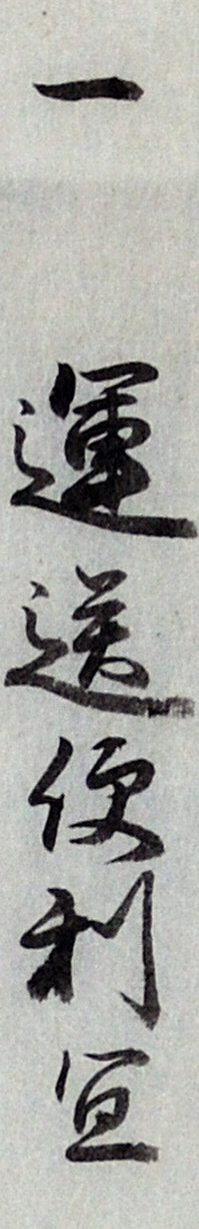一運送便利宜
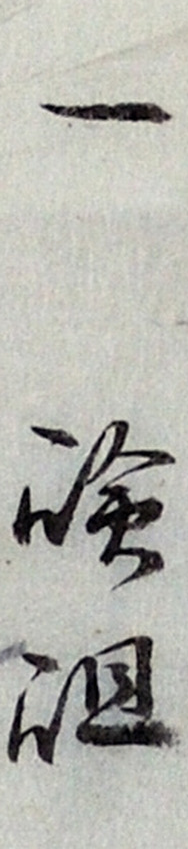一嶮岨
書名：官林反別帳
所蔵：伊那市立高遠町図書館・合同会社AMANE
